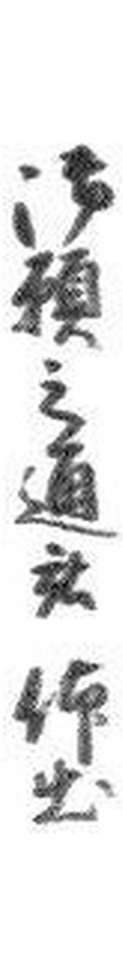御願之通被仰出
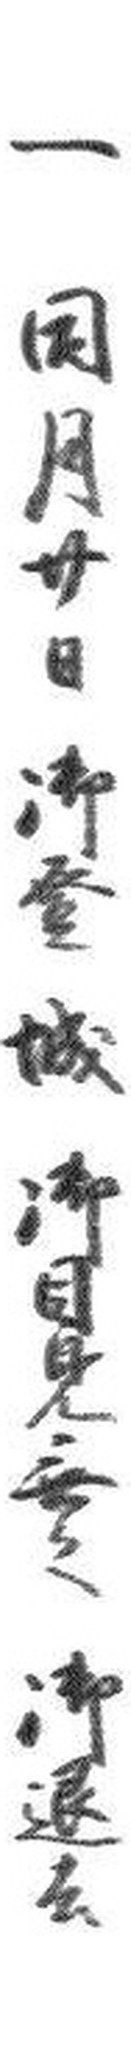一同月廿日御登城御目見無之御退去
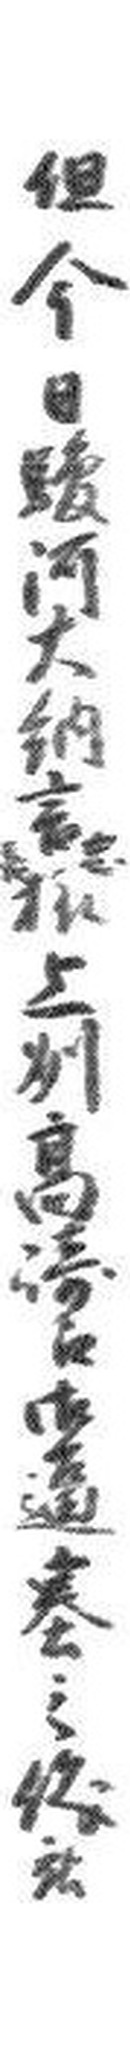但今日駿河大納言忠長様上州高崎江御逼塞之儀被

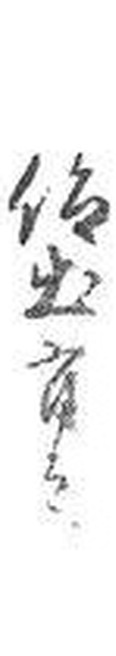仰出有之
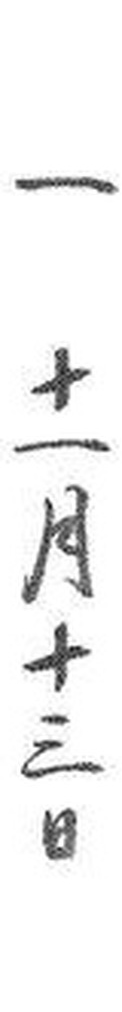一十一月十三日
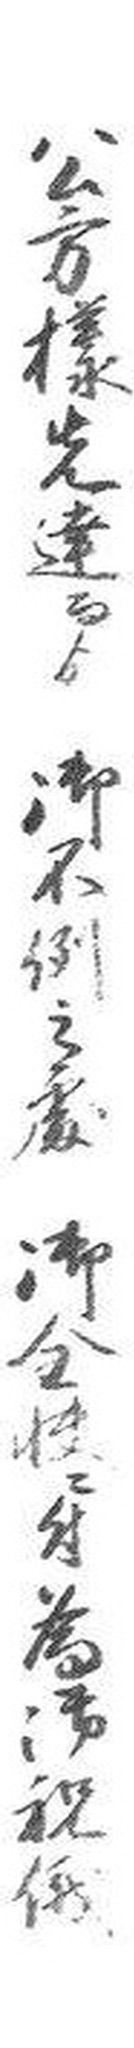公方様先達而ゟ御不例之処御全快ニ付為御祝儀
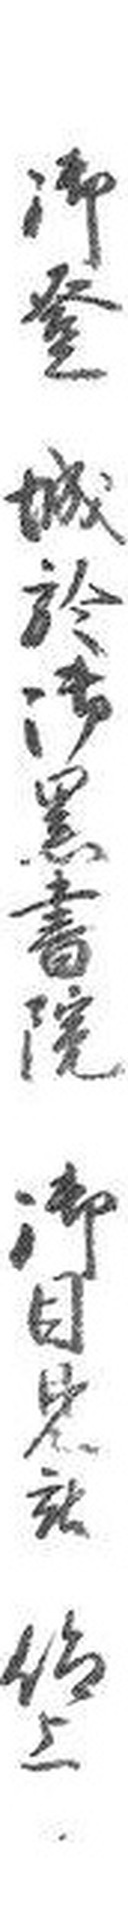御登城於御黒書院御目見被仰上
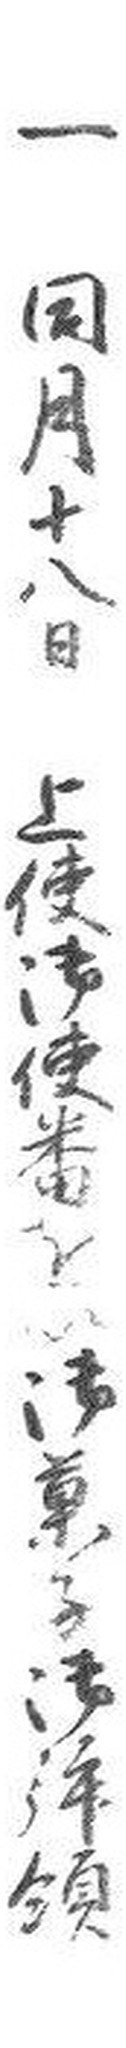一同月十八日上使御使番を以御菓子御拝領
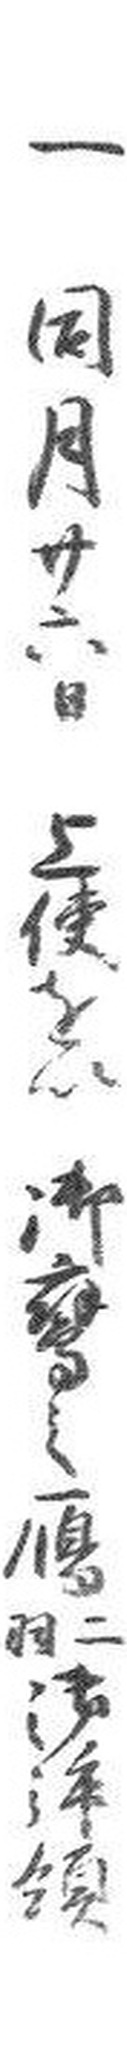一同月廿六日上使を以御鷹之鴈二羽御拝領
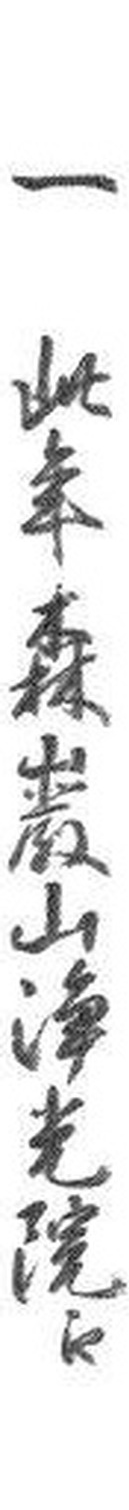一此年森巌山浄光院江
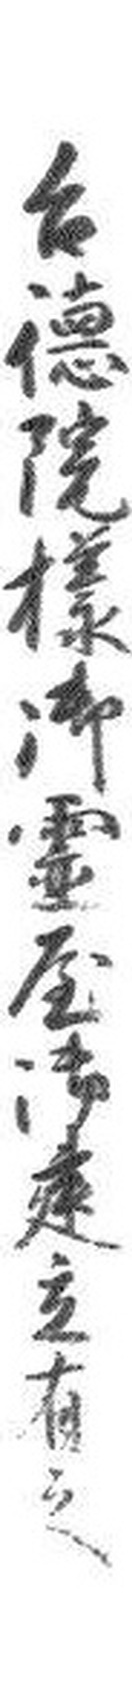台徳院様御霊屋御建立有之
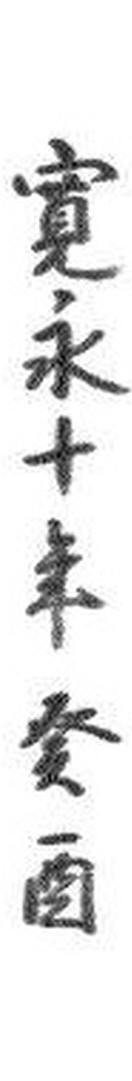寛永十年癸酉
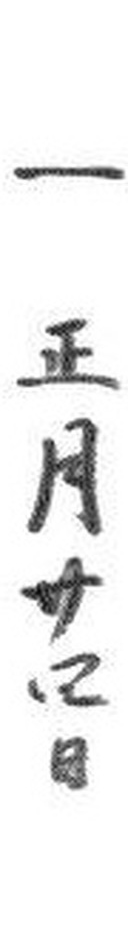一正月廿四日
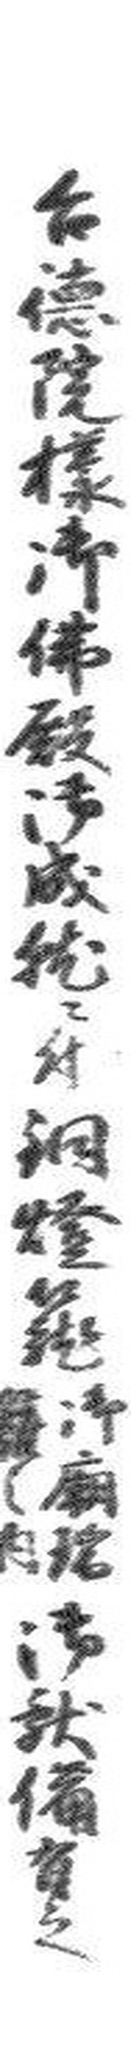台徳院様御仏殿御成就ニ付銅灯籠御廟瑞籬之内御献備有之
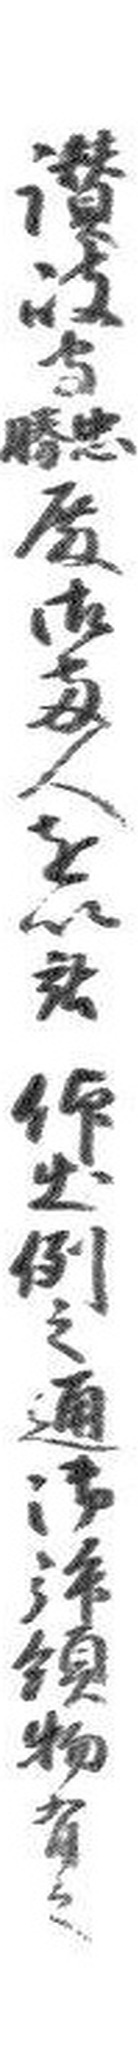讃岐守忠勝殿御両人を以被仰出例之通御拝領物有之
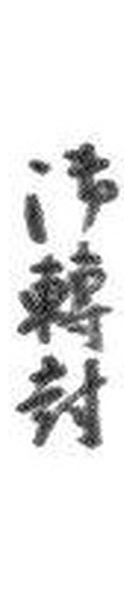御転封
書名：家譜 四 忠昌公 従寛永七年到正保四年
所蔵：福井県文書館 Fukui Prefectural Archives
